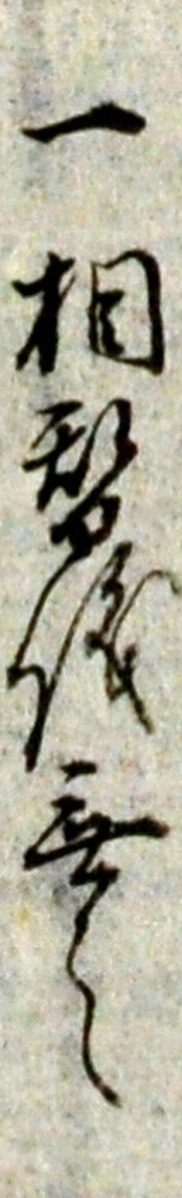一相替儀無之
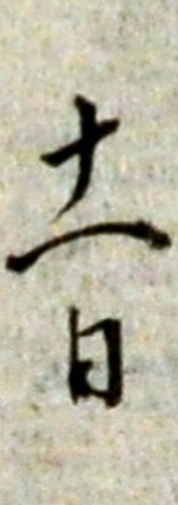十一日
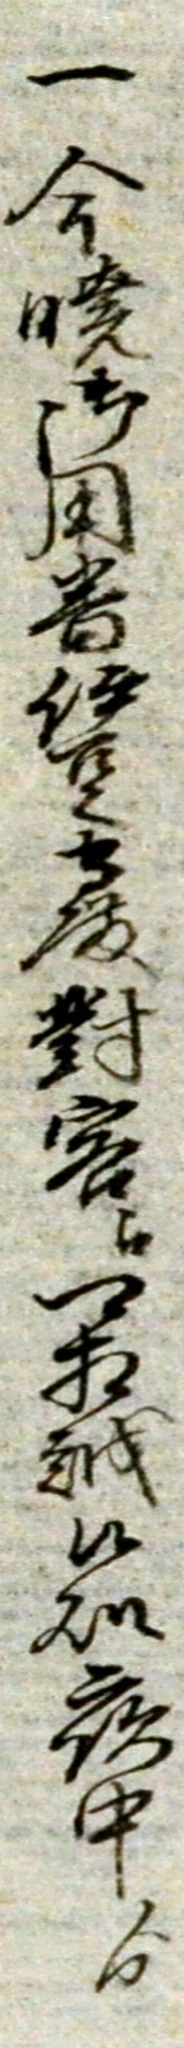一今暁御用番伊豆守殿対客江可相越候処夜中ゟ
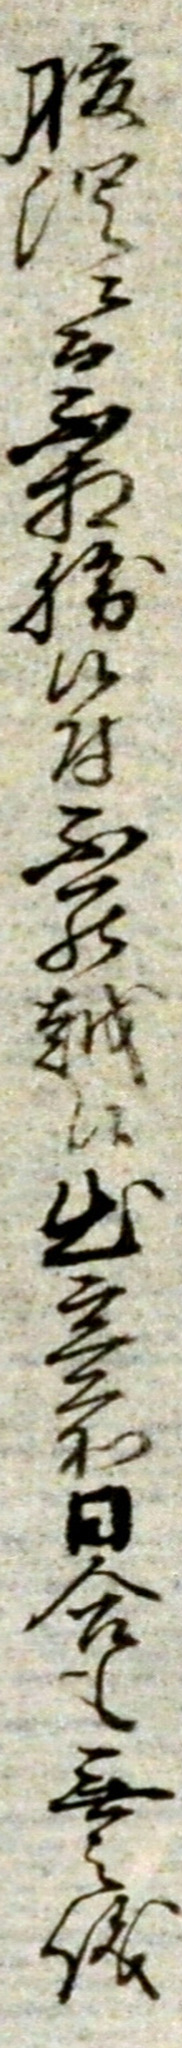服侭ニ而不相勝候付不罷越候出立前日合も無之儀
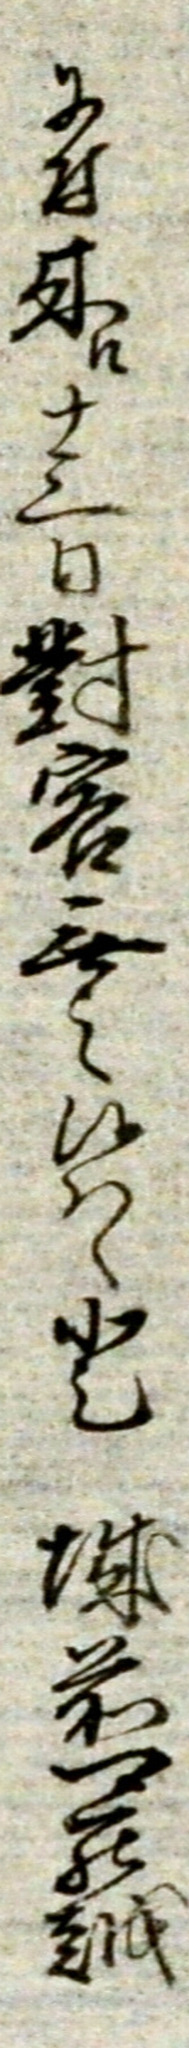ニ付来ル十三日対客無之候ハヽ登城前可罷越
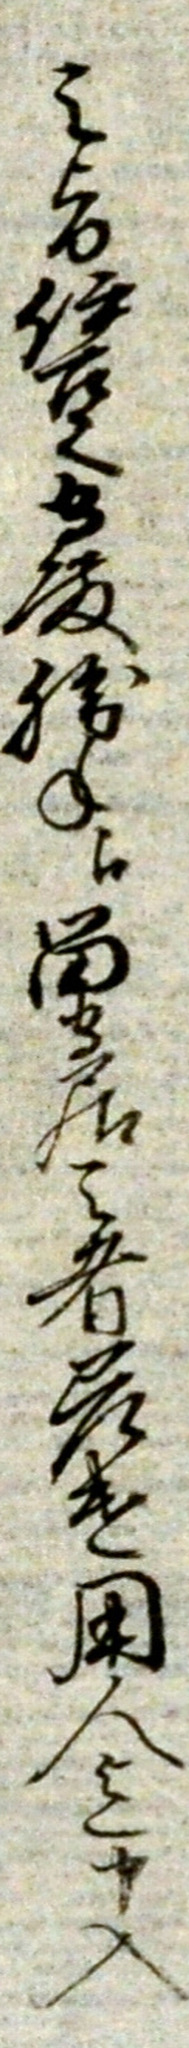之旨伊豆守殿勝手江留守居之者差遣用人迄申入
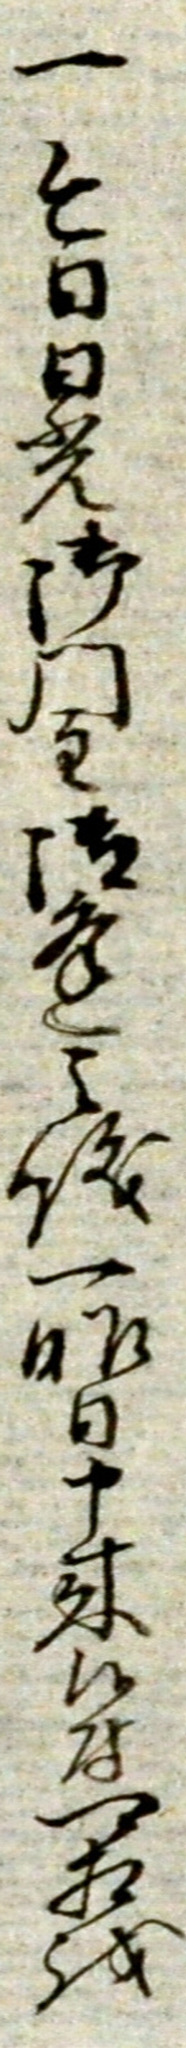一今日光御門主御逢之儀一昨日申来候付可相越
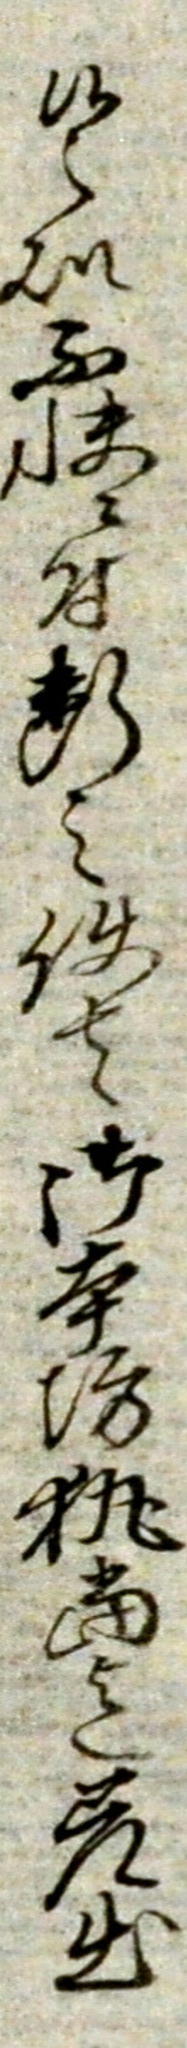候之処不快ニ付断之使者御本坊執当迄差出
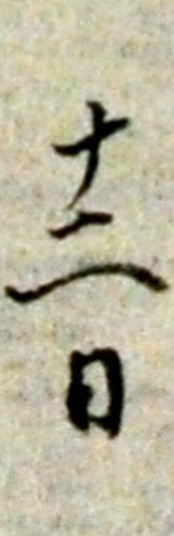十二日
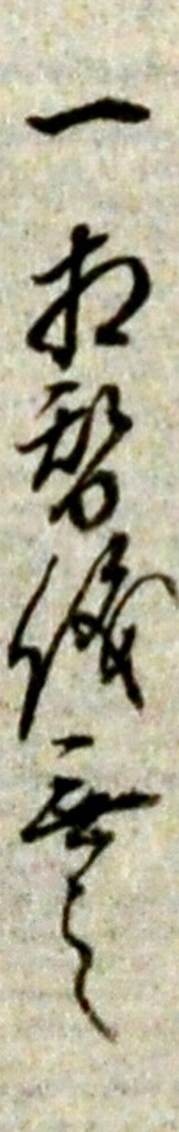一相替儀無之
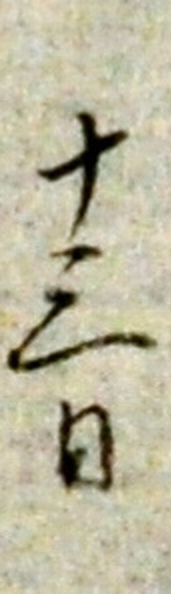十三日
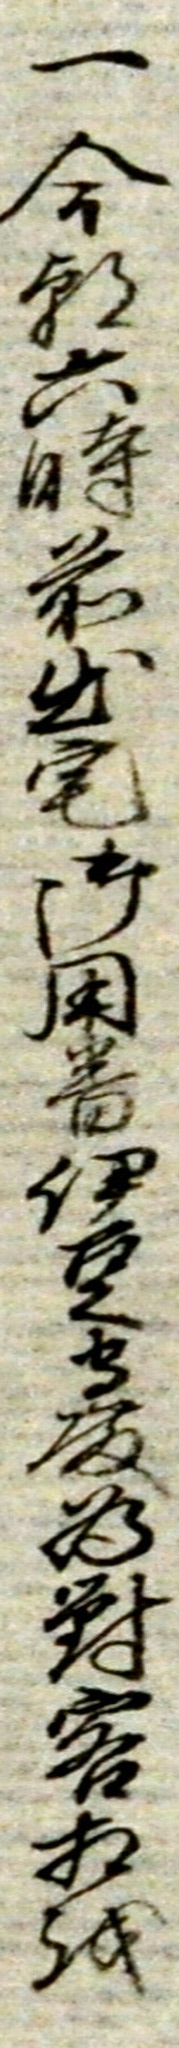一今朝六時前出宅御用番伊豆守殿為対客相越
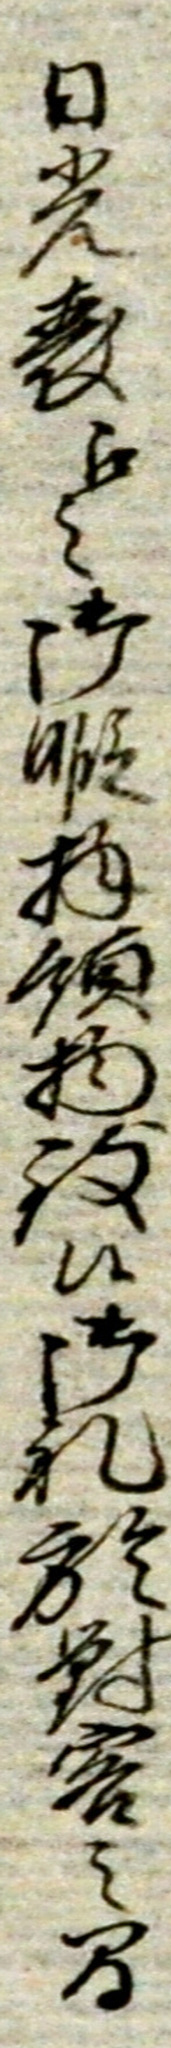日光表江之御暇拝領物致候御礼於対客之間
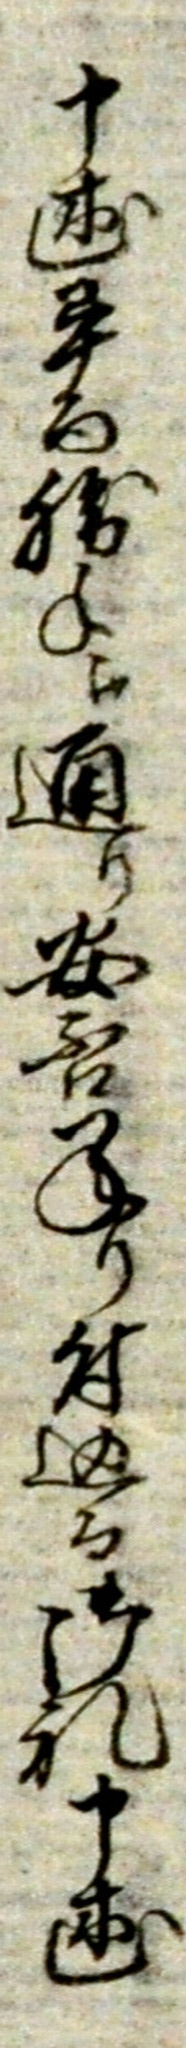申述畢而勝手江通り安否承り付込而御礼申述
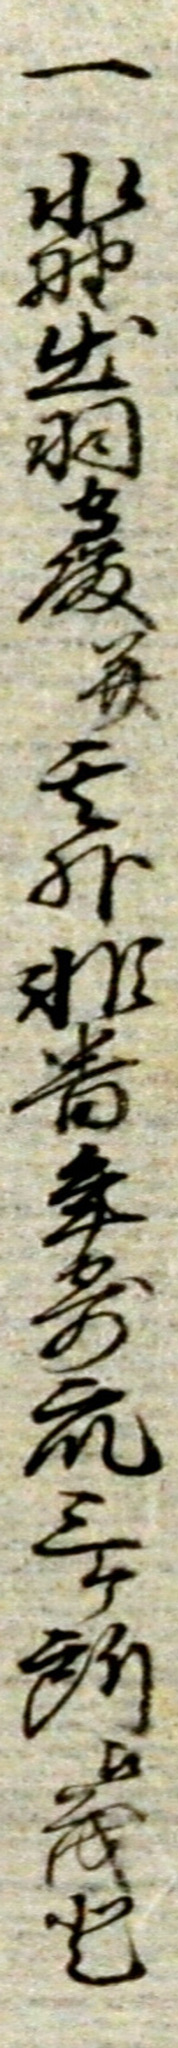一水野出羽守殿幷其外非番年寄衆三ヶ所江も登
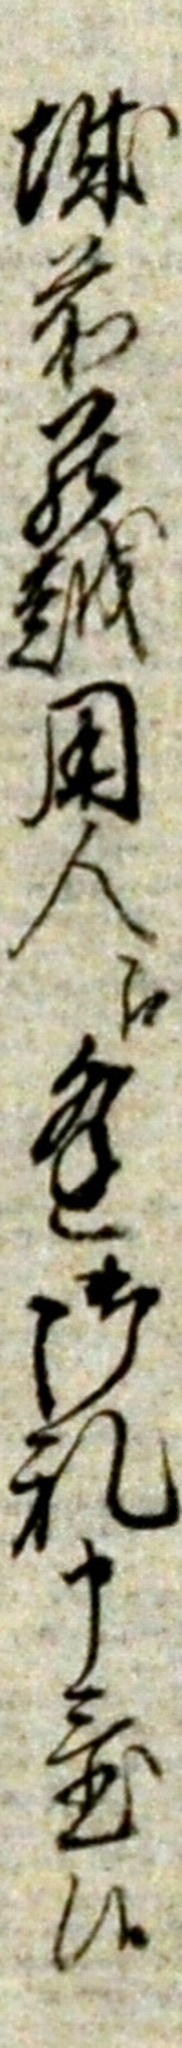城前罷越用人江逢御礼申置候
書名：日光御名代相勤候節ノ留
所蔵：伊那市立高遠町図書館・合同会社AMANE
